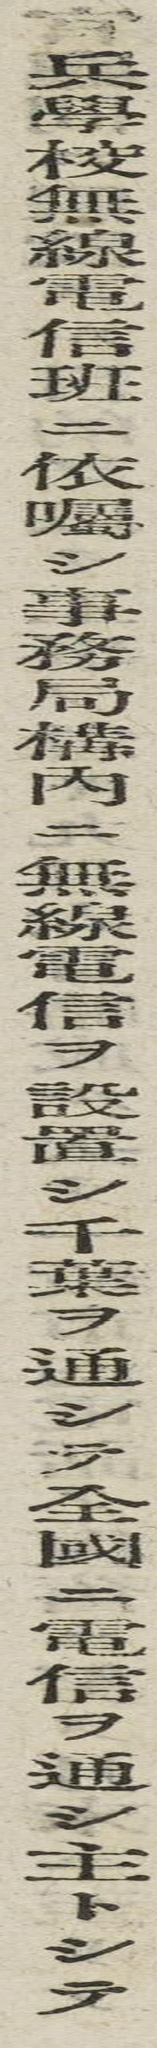兵学校無線電信班ニ依嘱シ事務局構内ニ無線電信ヲ設置シ千葉ヲ通シテ全国ニ電信ヲ通シ主トシテ
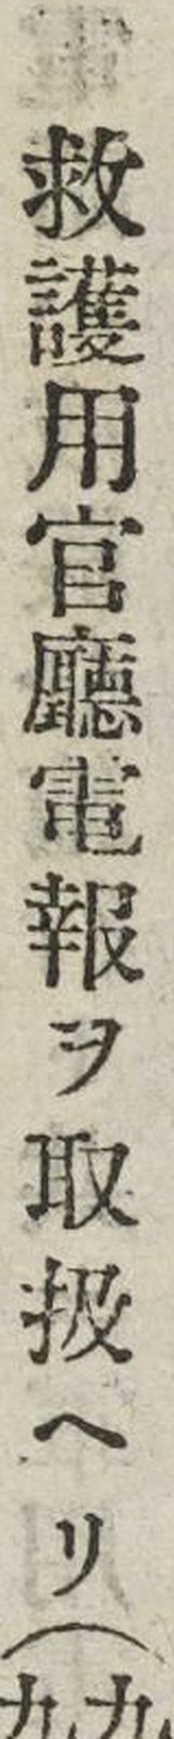救護用官庁電報ヲ取扱ヘリ
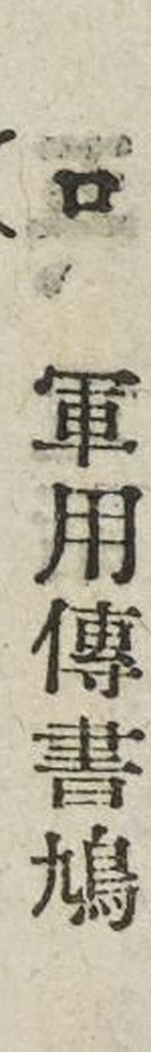軍用伝書鳩
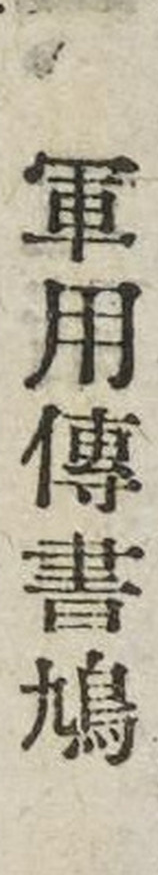軍用伝書鳩
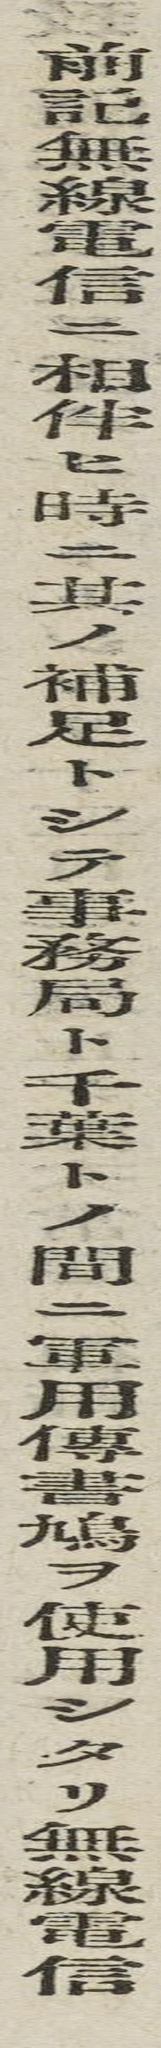前記無線電信ニ相伴ヒ時ニ其ノ補足トシテ事務局ト千葉トノ間ニ軍用伝書鳩ヲ使用シタリ無線電信
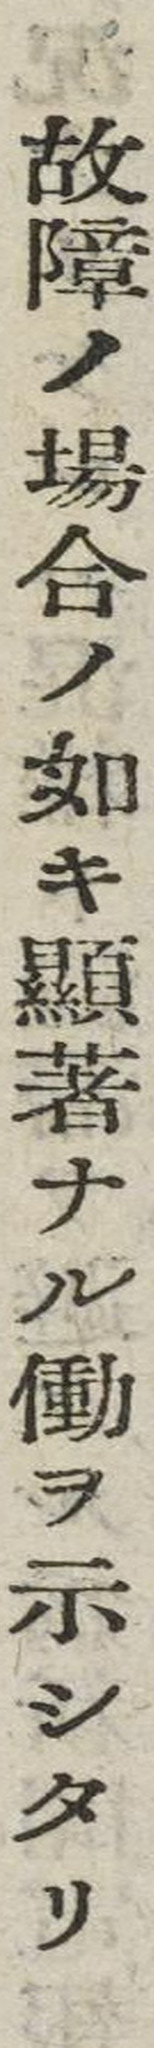故障ノ場合ノ如キ顕著ナル働ヲ示シタリ
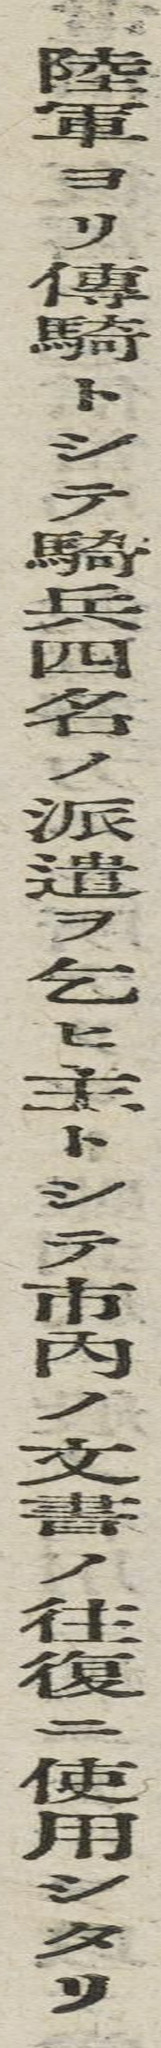陸軍ヨリ伝騎トシテ騎兵四名ノ派遣ヲ乞ヒ主トシテ市内ノ文書ノ往復ニ使用シタリ
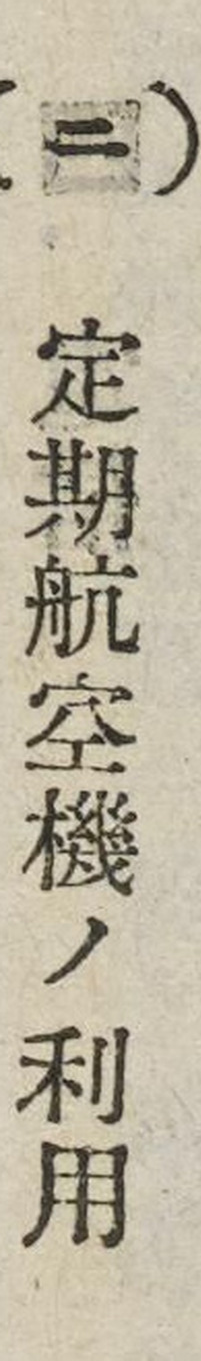定期航空機ノ利用
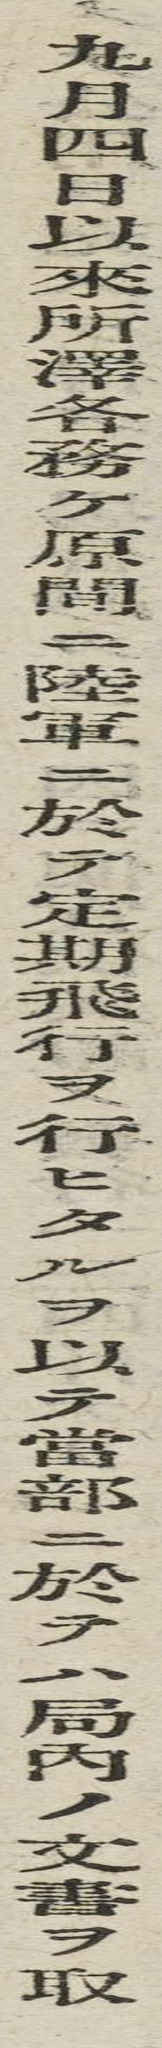九月四日以来所沢各務ケ原間ニ陸軍ニ於テ定期飛行ヲ行ヒタルヲ以テ当部ニ於テハ局内ノ文書ヲ取
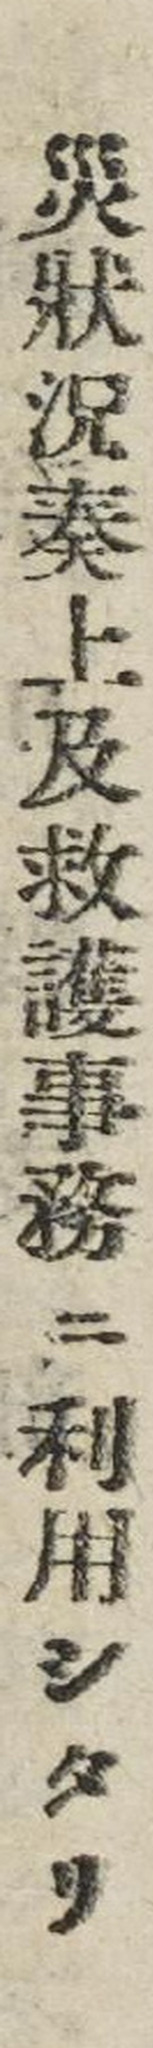災状況奏上及救護事務ニ利用シタリ
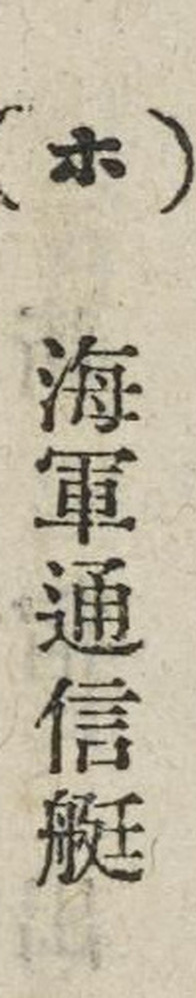海軍通信艇
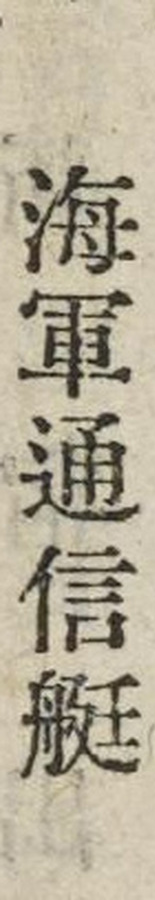海軍通信艇
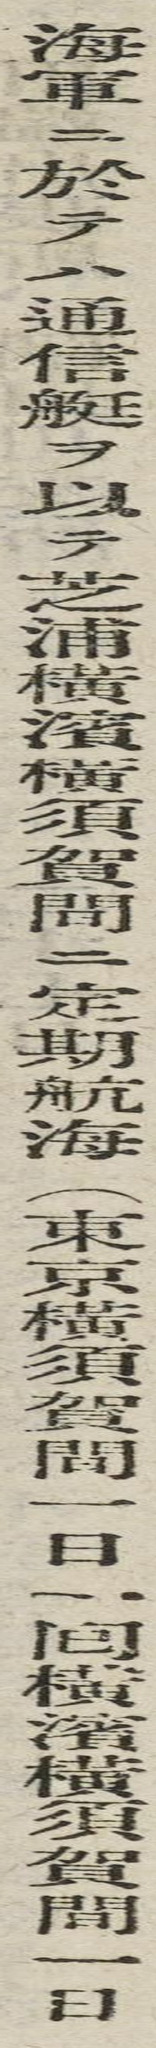海軍ニ於テハ通信艇ヲ以テ芝浦横浜横須賀間ニ定期航海（東京横須賀間一日一回横浜横須賀間一日
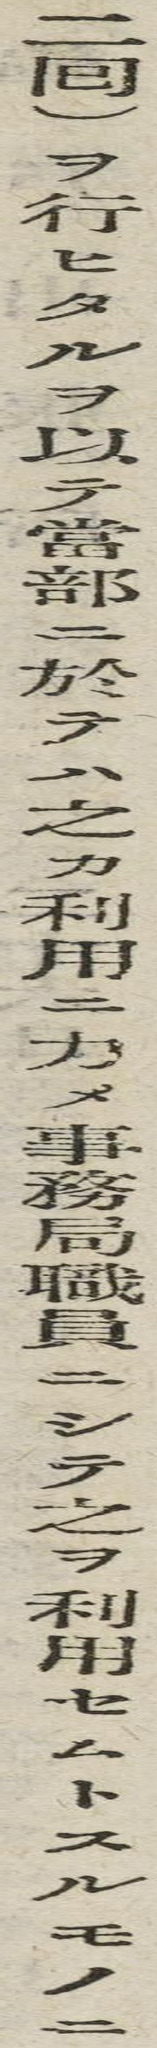二回）ヲ行ヒタルヲ以テ当部ニ於テハ之カ利用ニ力メ事務局職員ニシテ之ヲ利用セムトスルモノニ
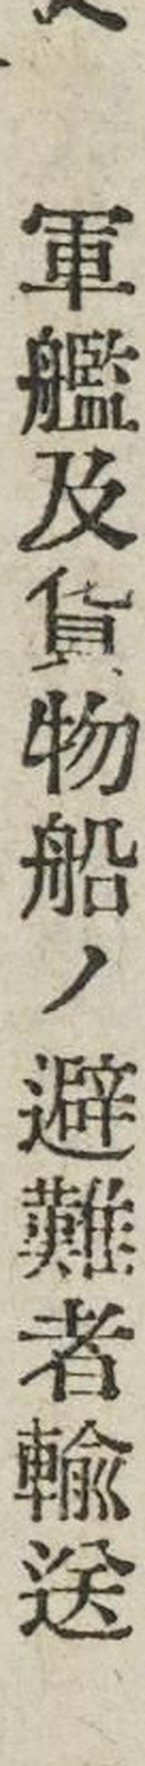軍艦及貨物船ノ避難者輸送
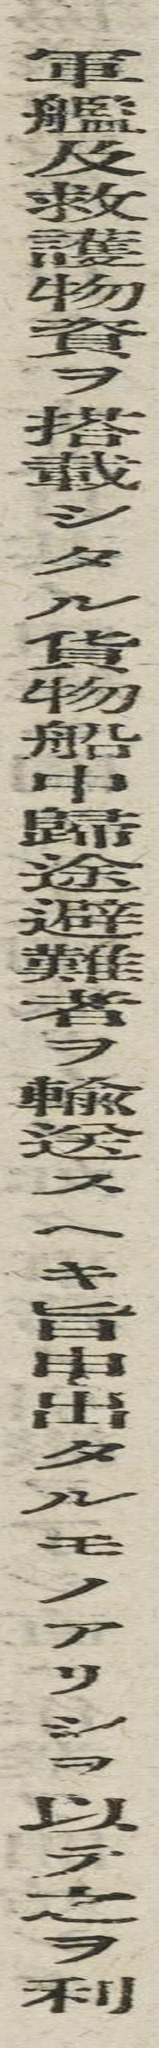軍艦及救護物資ヲ搭載シタル貨物船中帰途避難者ヲ輸送スヘキ旨申出タルモノアリシヲ以テ之ヲ利
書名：震災被害状況並救護施設概要
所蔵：東京大学地震研究所図書室 Earthquake Research Institute Library, The University of Tokyo, JAPAN
